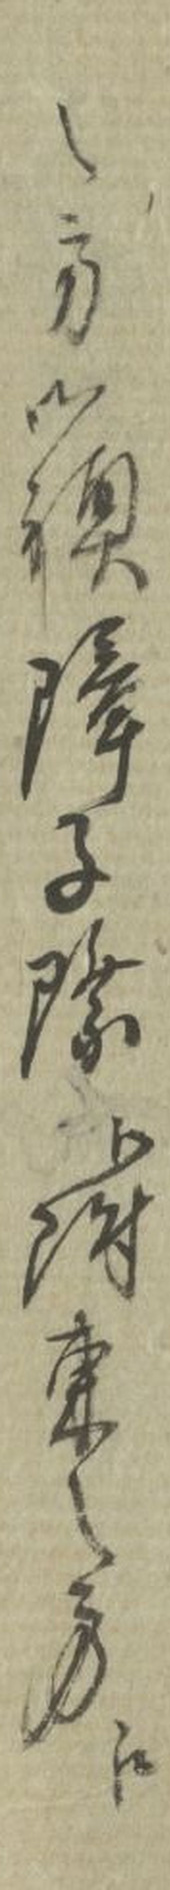之方御襖障子際え附東之方え
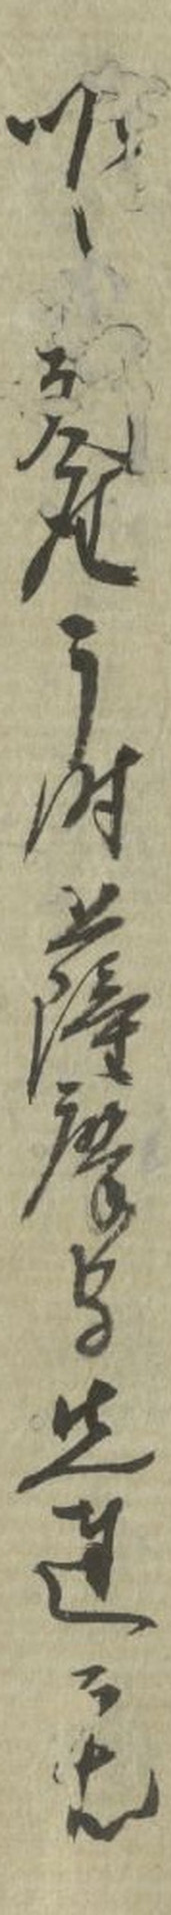順々列座于時薩摩守先達而右
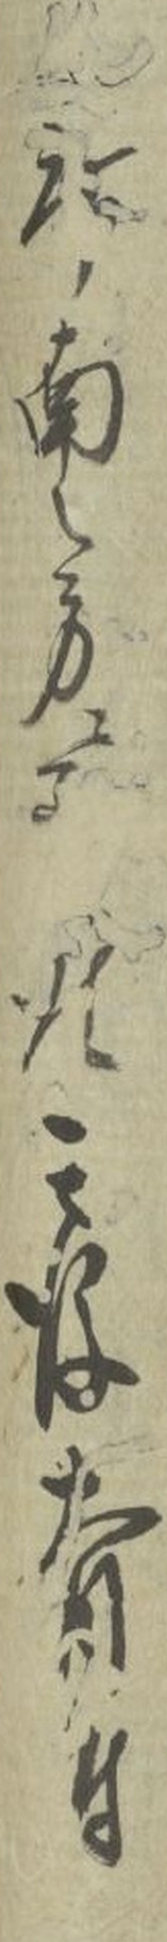之席南之方に着座其後大目付
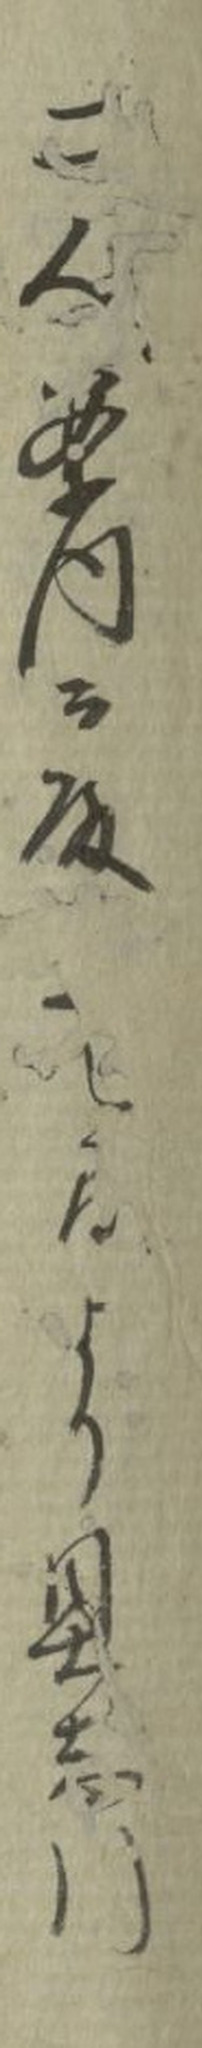二人案内而殿上之間より具志川
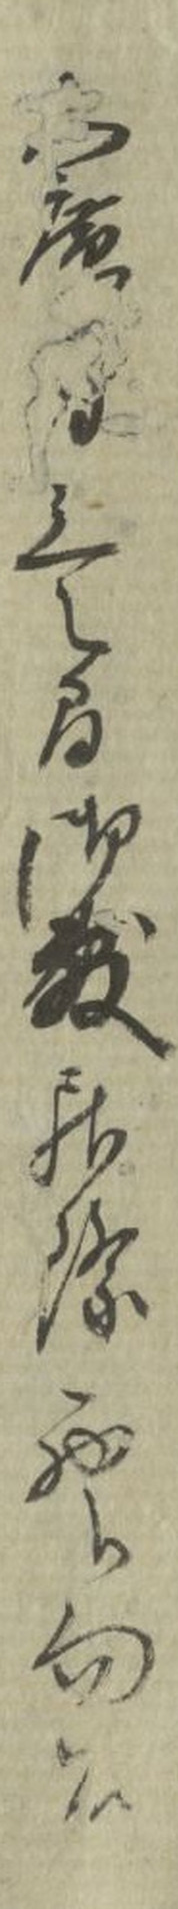大広間三之間御敷居際西え向着
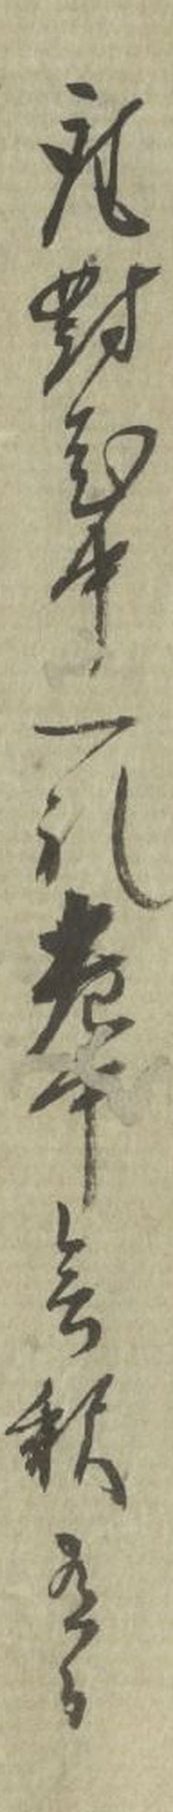座対老中一礼老中会釈有而
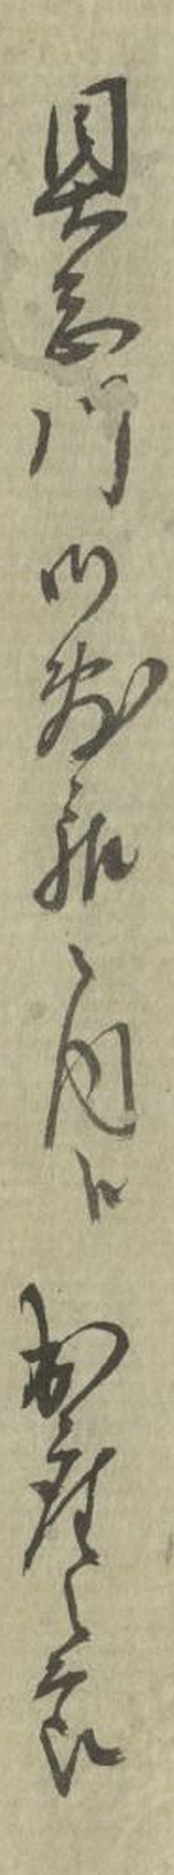具志川御敷居之内え出座之節
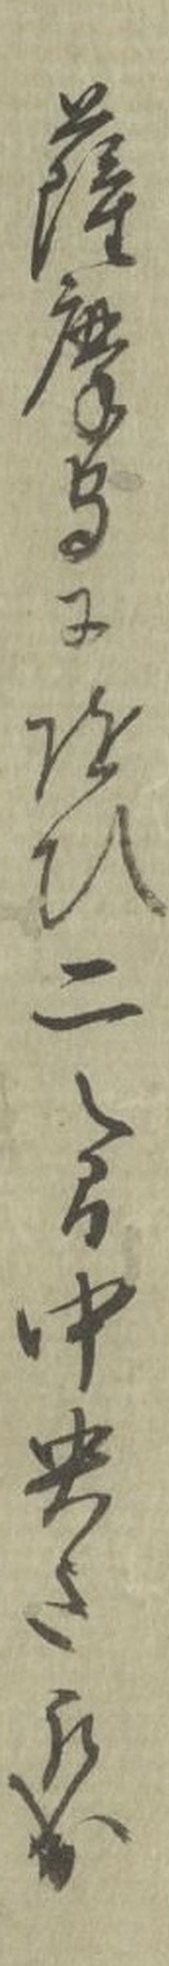薩摩守に随ひ二之間中央迄罷出

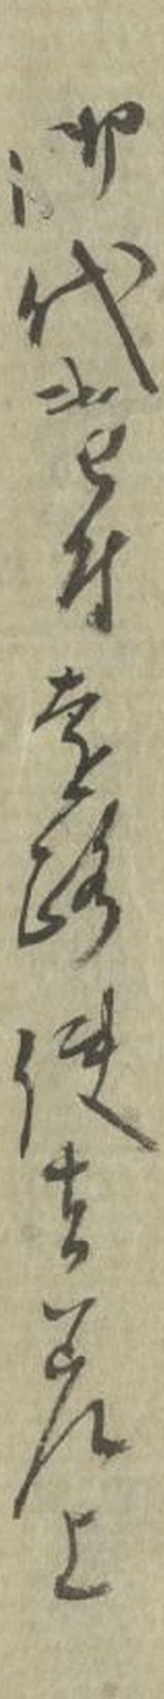御代替付遠路使者差上
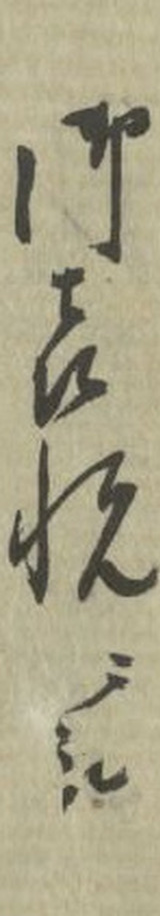御喜悦に被
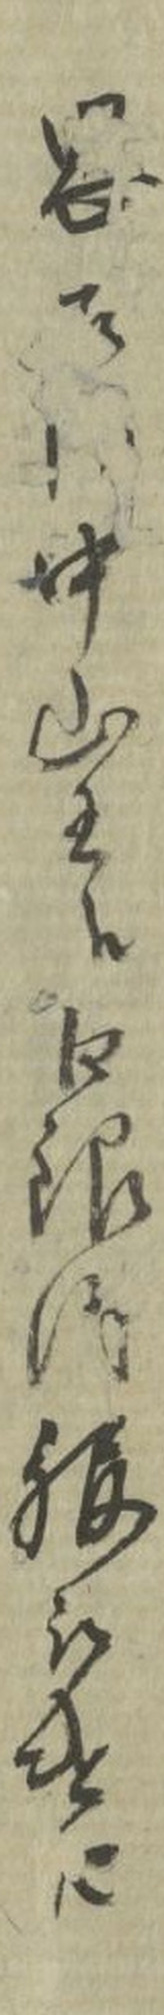思召中山王え白銀時服被遣下
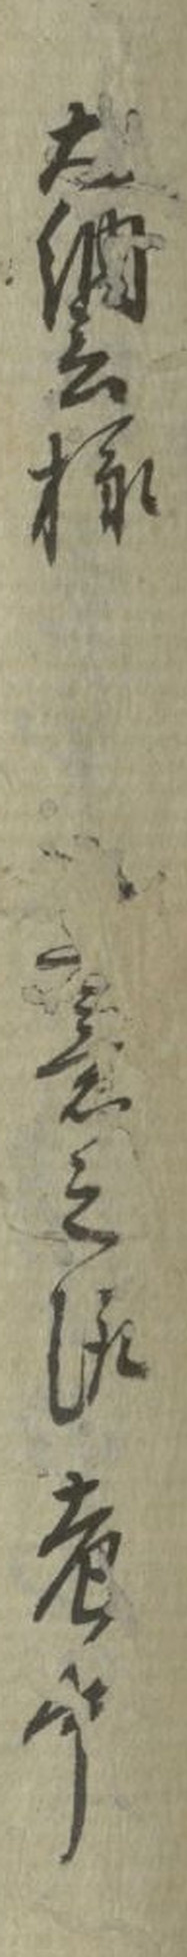大納言様上意之趣老中
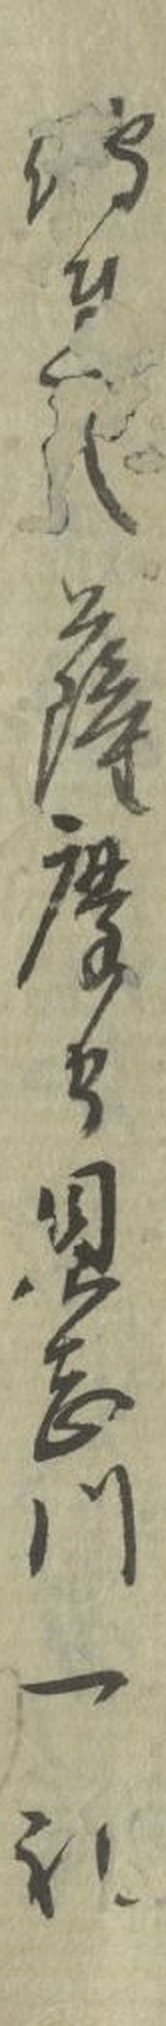伝達之薩摩守具志川一礼
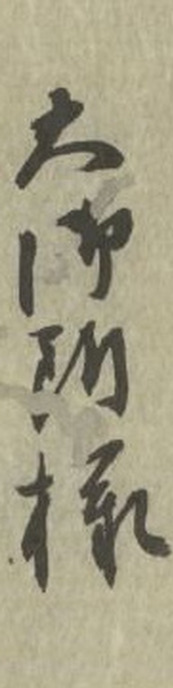大御所様
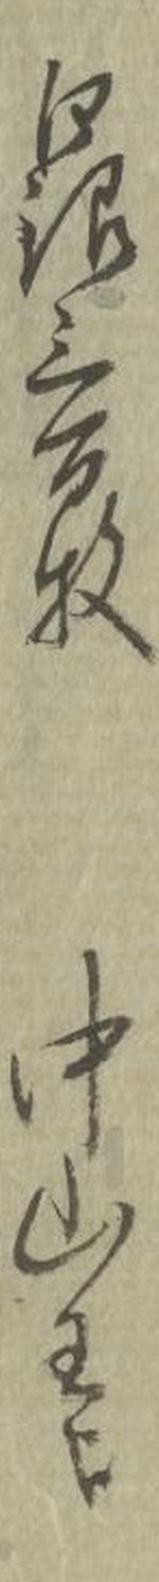白銀三百枚中山王え

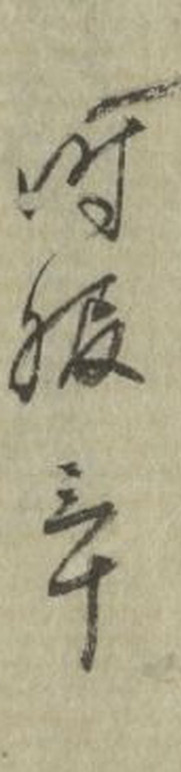時服三十
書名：琉球来朝記 自八至十四終
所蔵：University of the Ryukyus Library
